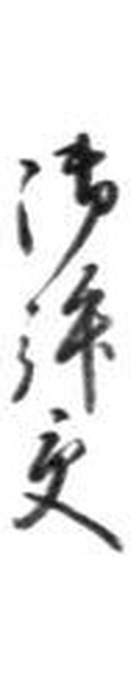御拝受
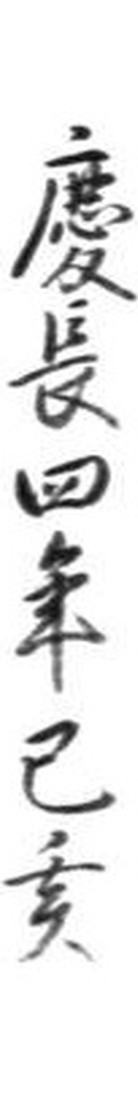慶長四年己亥
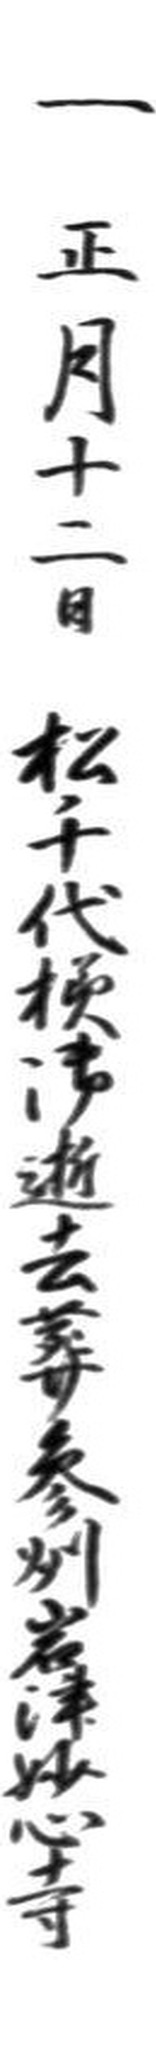一正月十二日松千代様御逝去葬参州岩津妙心寺
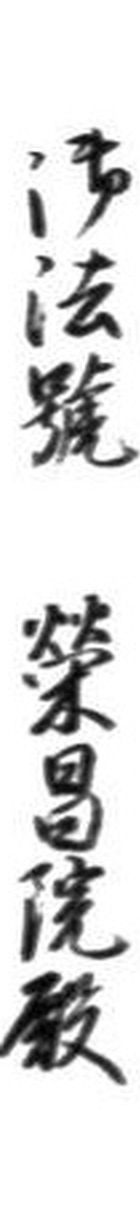御法号栄昌院殿
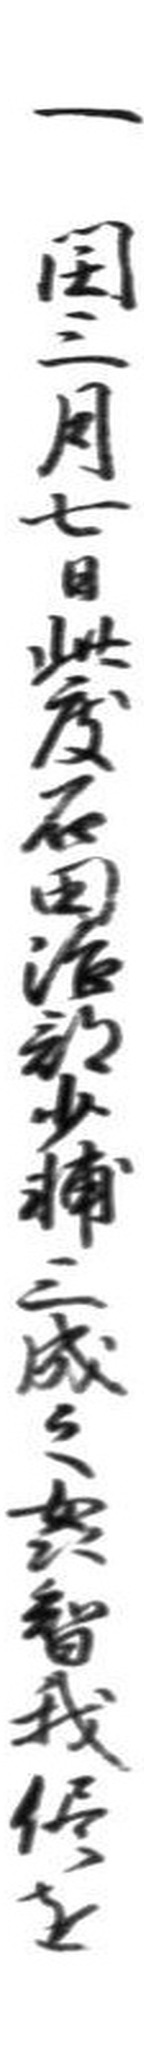一閏三月七日此度石田治部少輔三成之姦智我侭を
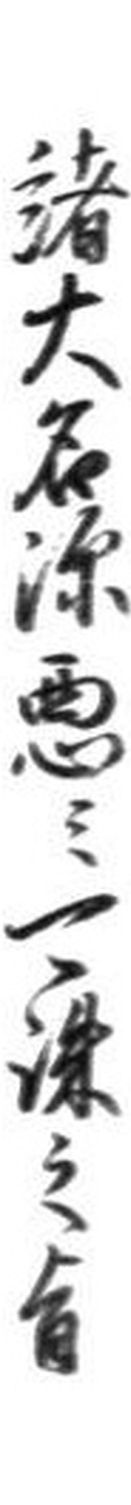諸大名深悪ミ可誅之旨
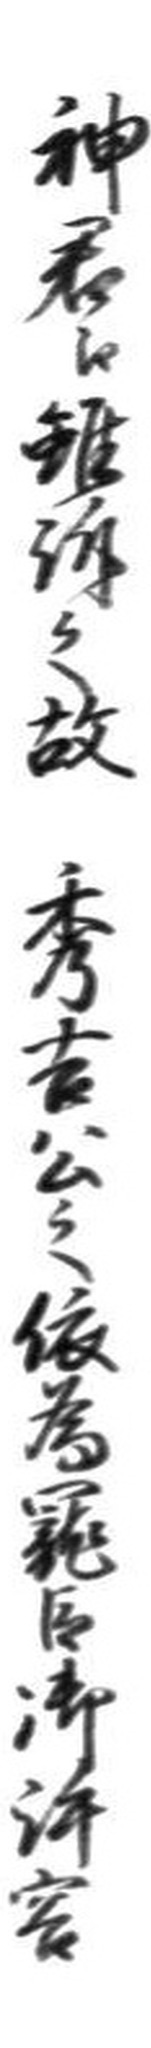神君江雖訴之故秀吉公之依為寵臣御許容
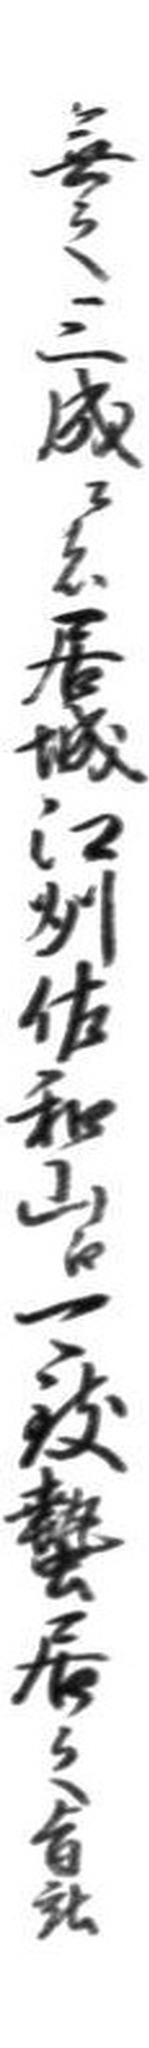無之三成ニ者居城江州佐和山江可致蟄居之旨被
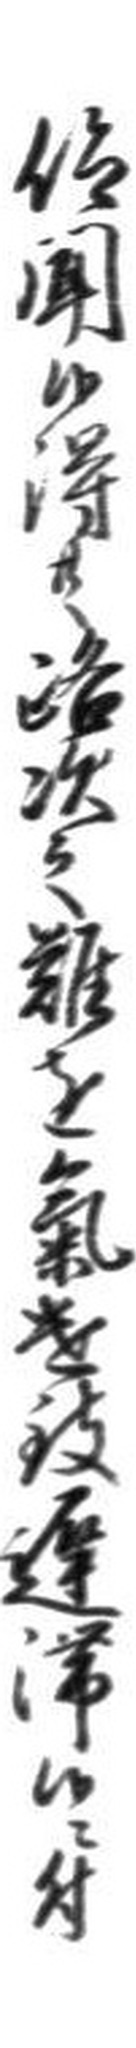仰聞候得共路次之難を気遣致遅滞候ニ付
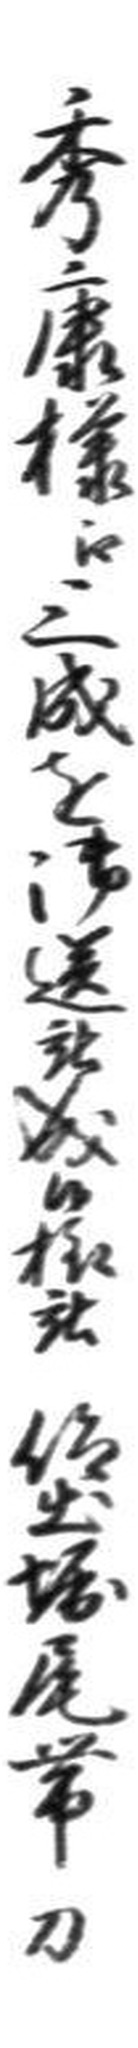秀康様江三成を御送被成候様被仰出堀尾帯刀

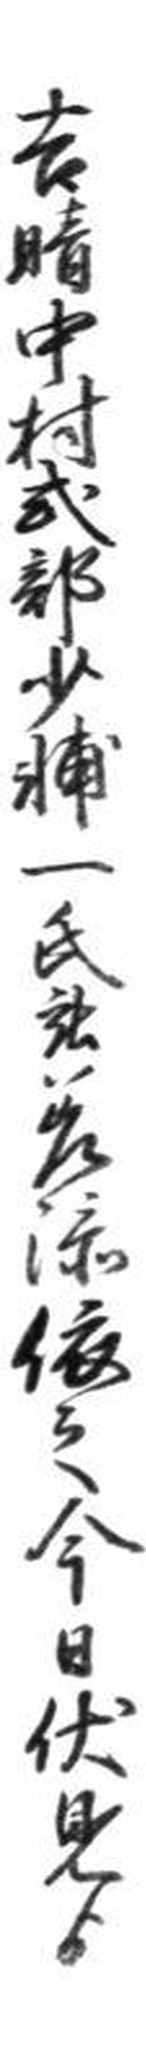吉晴中村式部少輔一氏被差添依之今日伏見ゟ
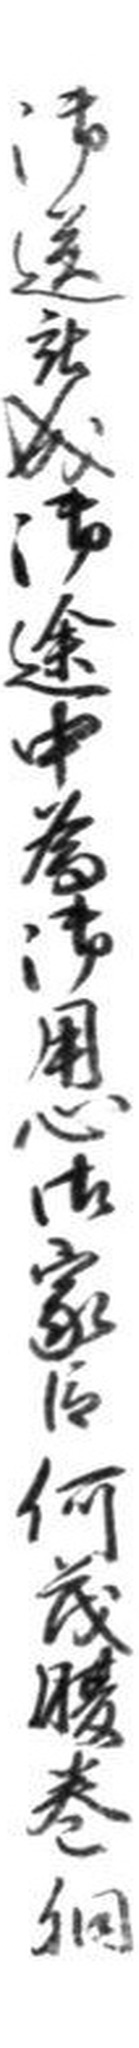御送被成御途中為御用心御家臣何も腹巻胴
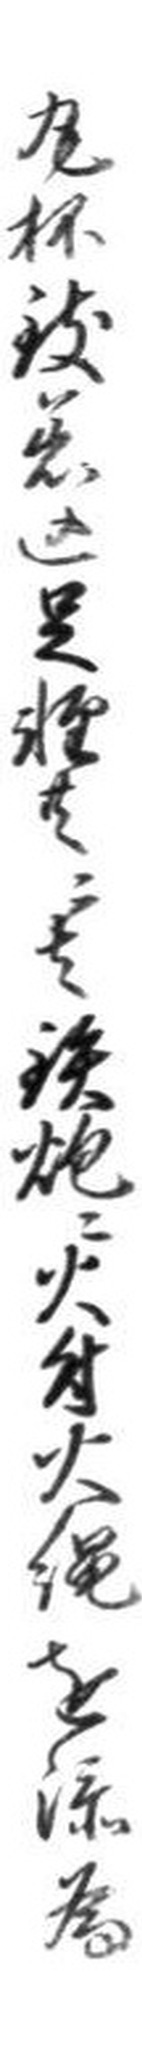丸抔致着込足軽共ニ者鉄砲ニ火付火縄を添為
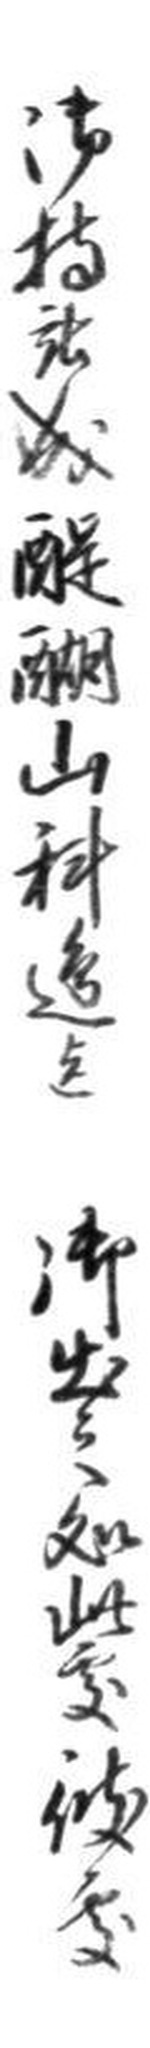御持被成醍醐山科辺迄御出之処此処彼処
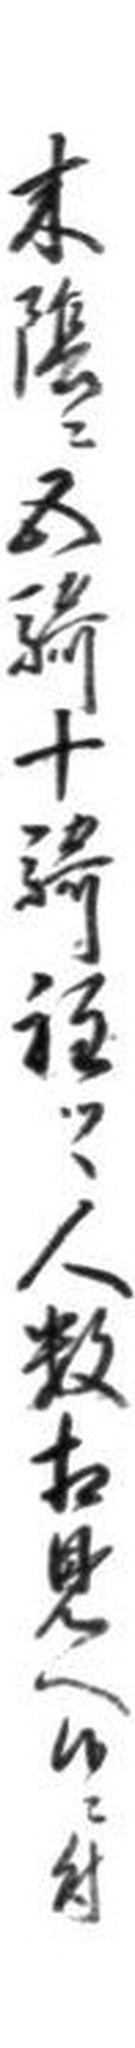木陰ニ五騎十騎程ツヽ人数相見へ候ニ付
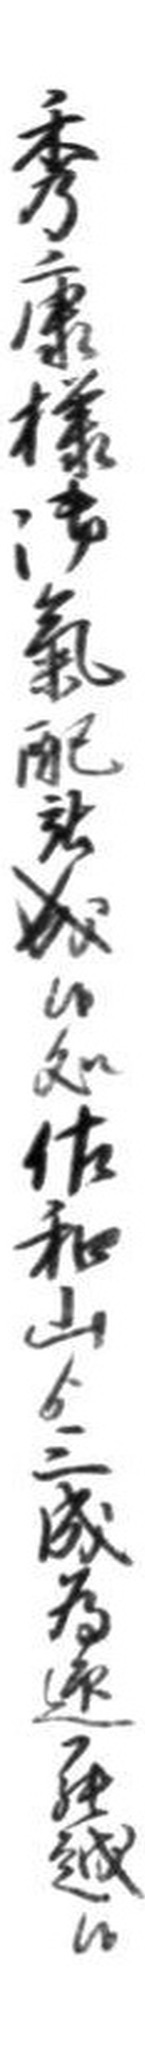秀康様御気配被成候処佐和山ゟ三成為迎罷越候
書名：家譜 一 秀康公 従天正二年到慶長十二年
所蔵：福井県文書館 Fukui Prefectural Archives
